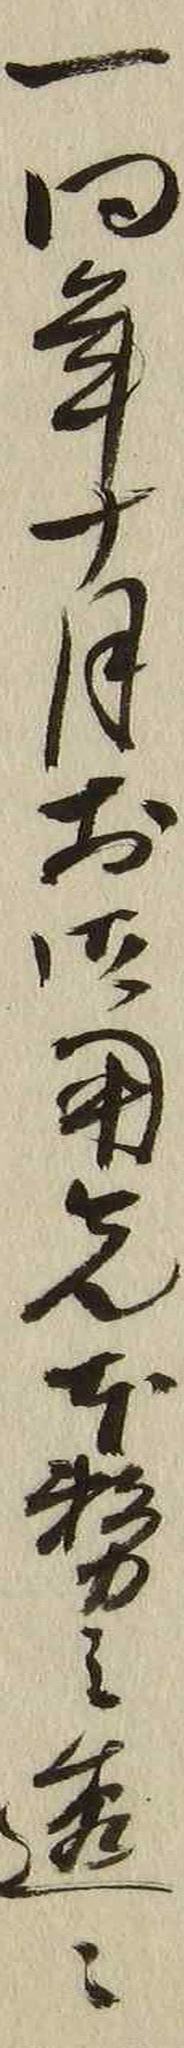一同年十月於御用先本務之透に
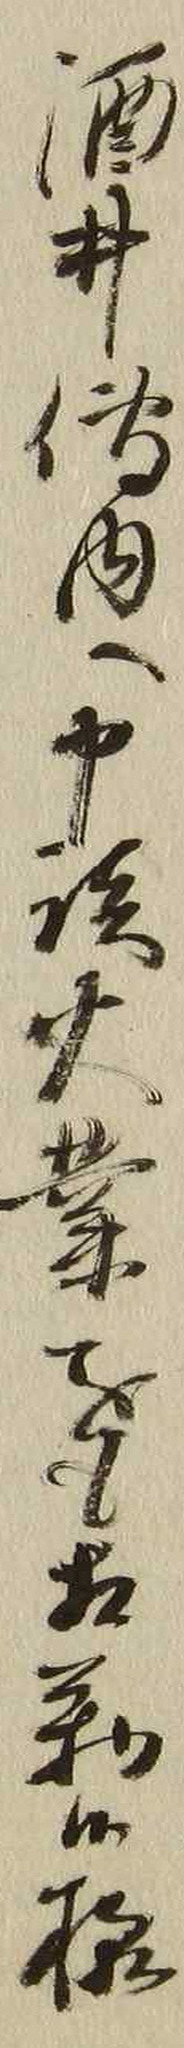酒井伝内へ申談火業をも相勤候様
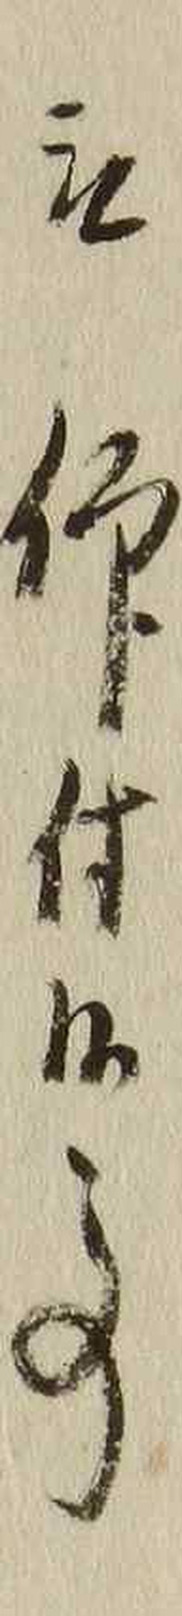被仰付候事
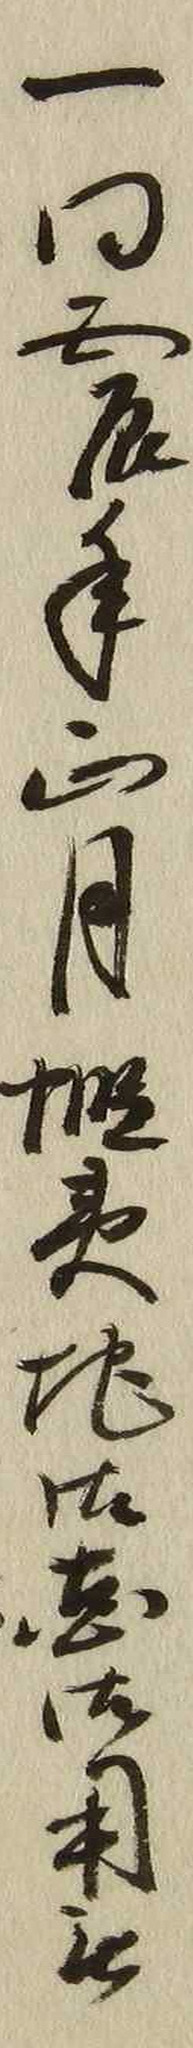一同五辰年正月蝦夷地御国御用被
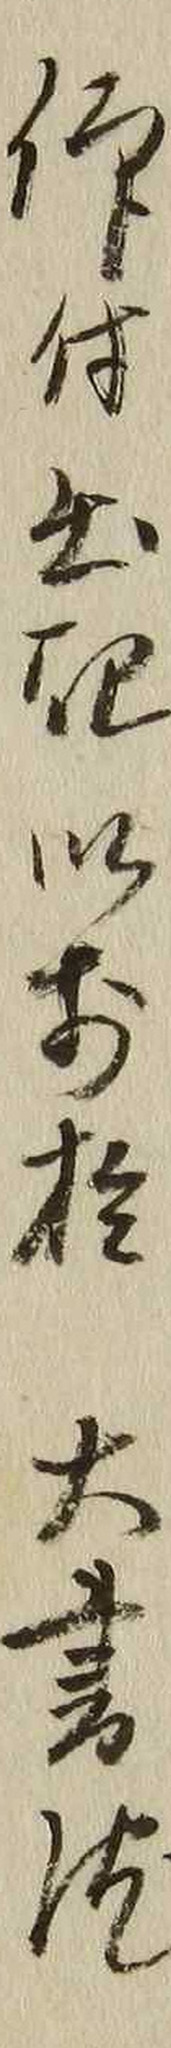仰付出起以前於大書院
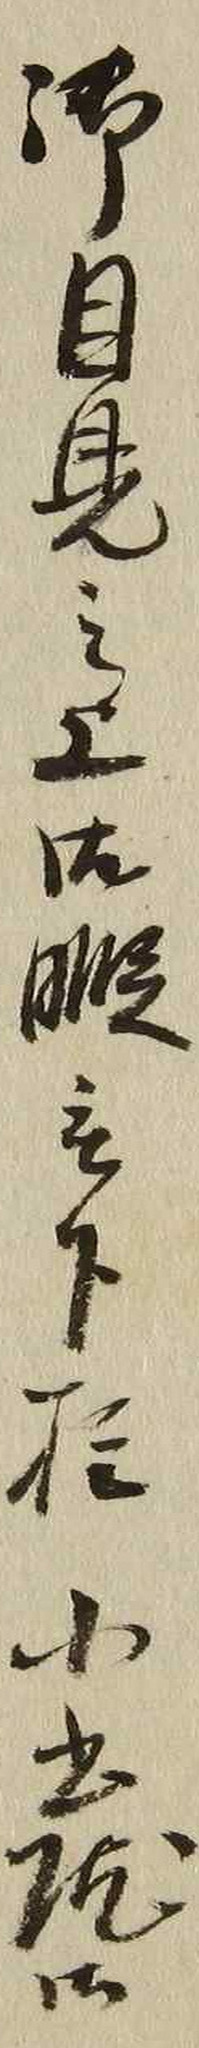御目見之上御暇被下於小書院御
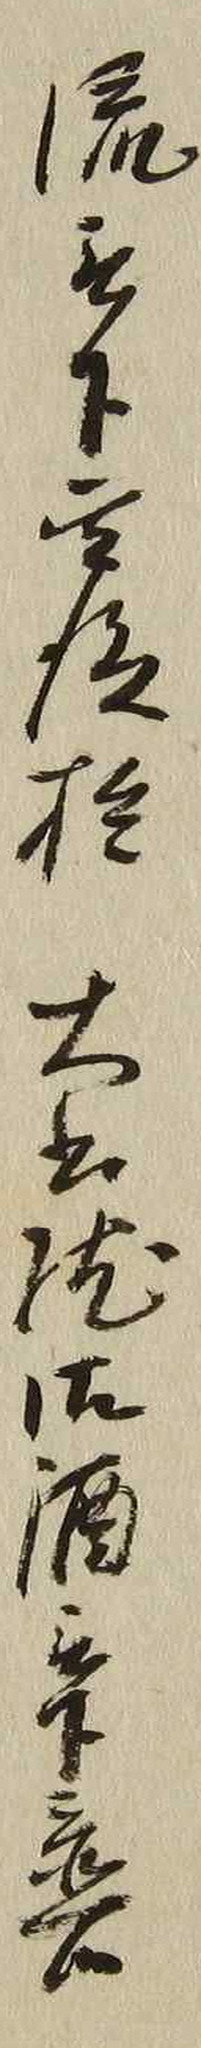流被下其後於大書院御酒被下置候
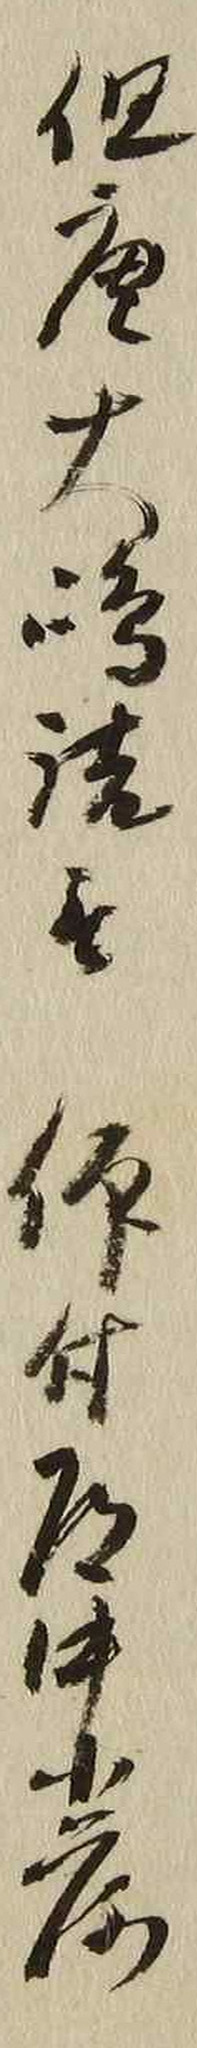但唐大嶋詰被仰付道中小荷
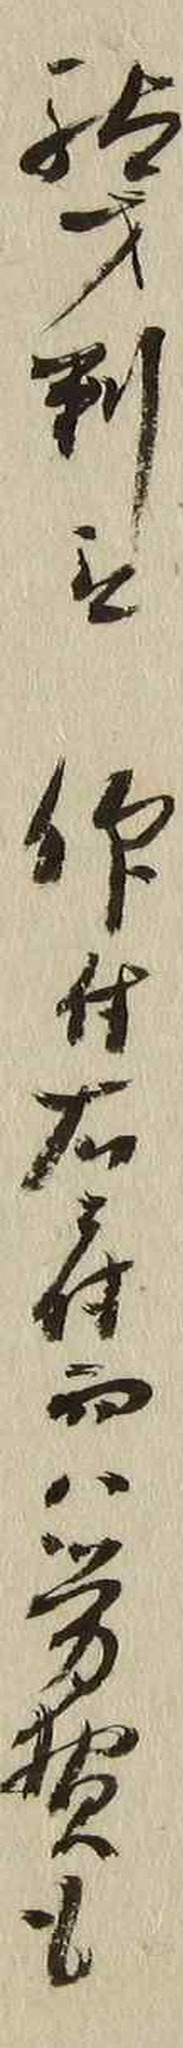駄才料被仰付右に付而は労賃も
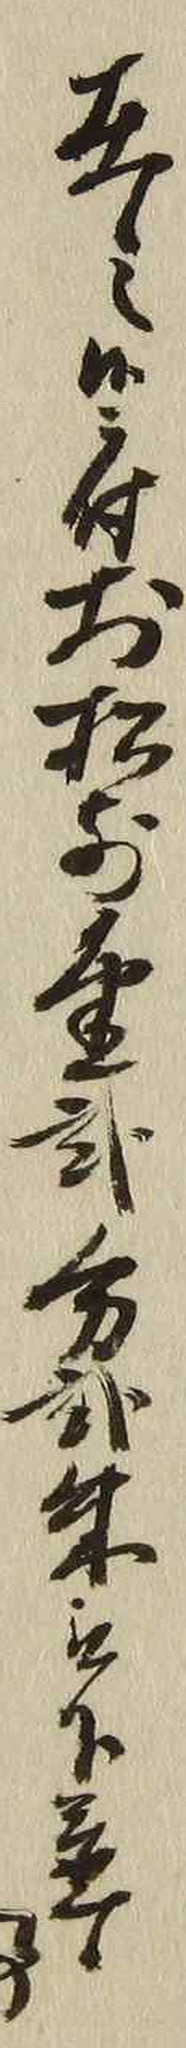在之候に付於松前金弐分弐朱被下置候事
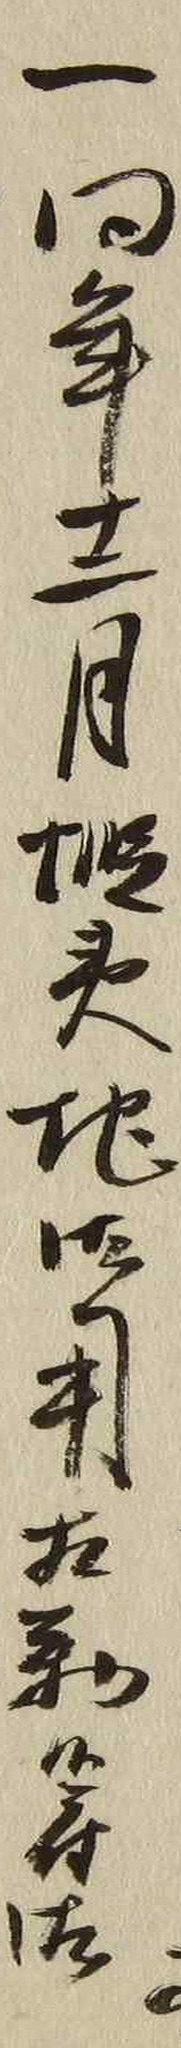一同年十二月蝦夷地御用相勤候に付御
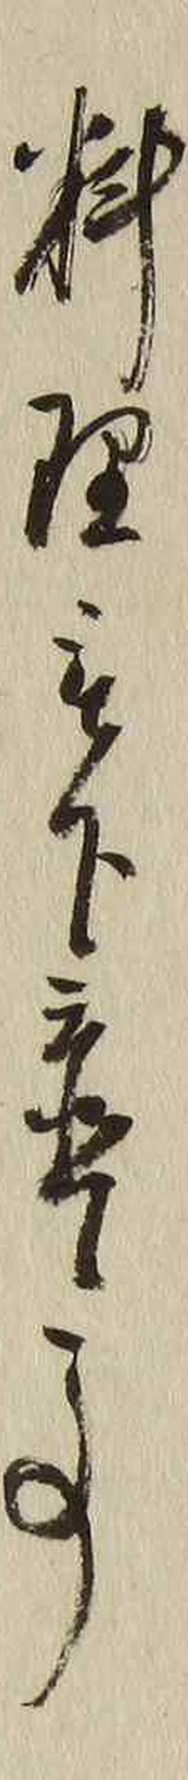料理被下置候事
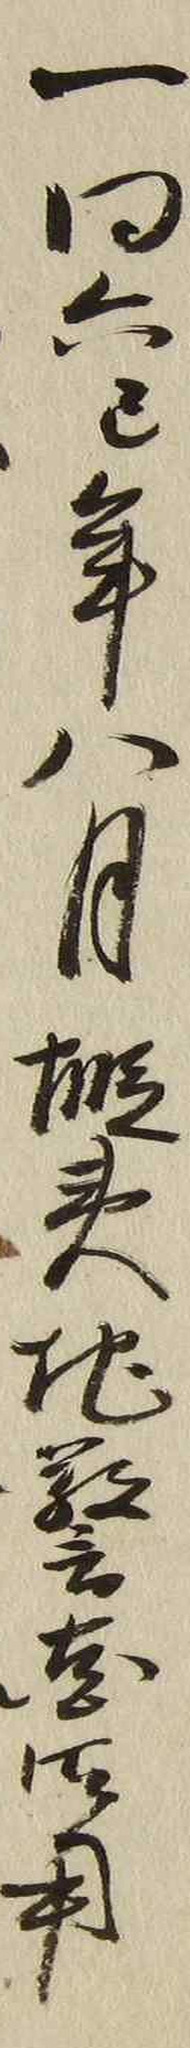一同六己年八月蝦夷地警固御用
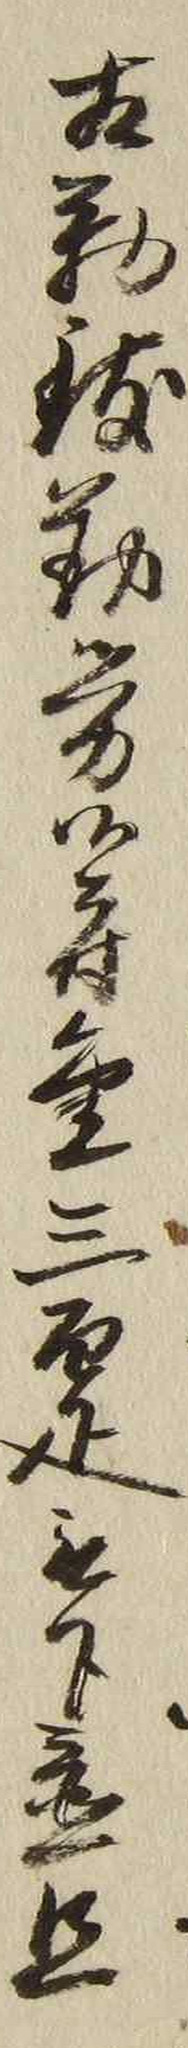相勤致勤労候に付金三百疋下置且
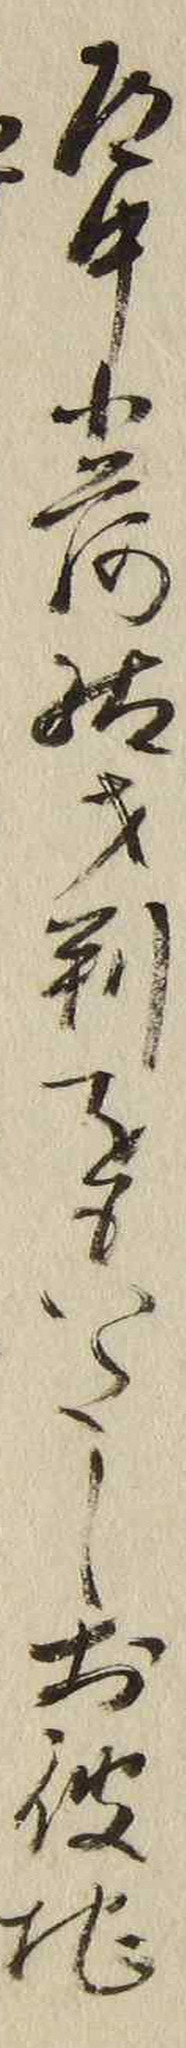道中小荷駄才料をもいたし於彼地
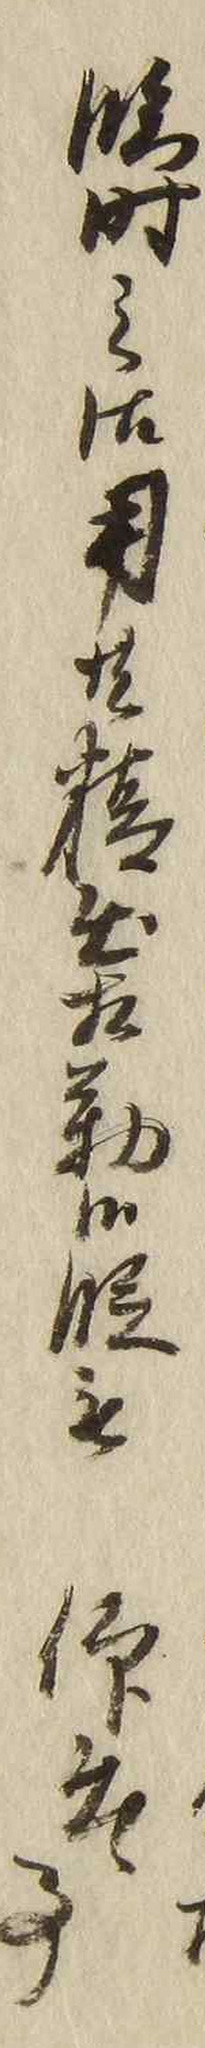臨時之御用共精出相勤候段被仰出候事
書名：諸士系譜　巻之360　す之部10
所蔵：会津若松市立会津図書館
